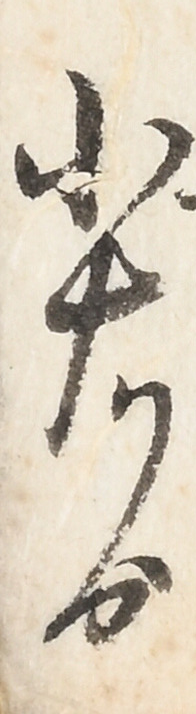小右衛門

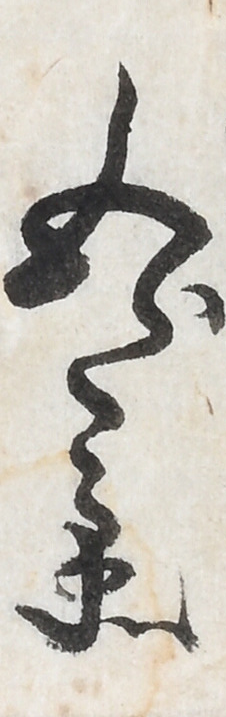五郎兵衛
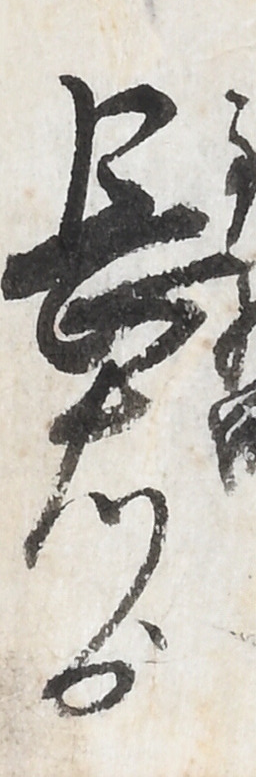◔長右衛門
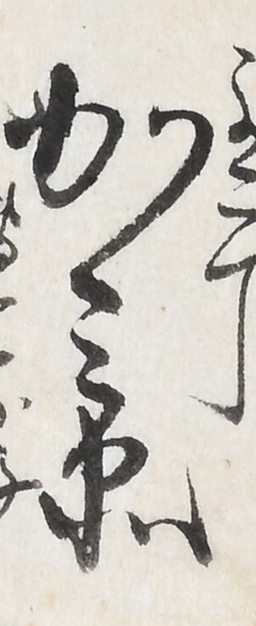加兵衛
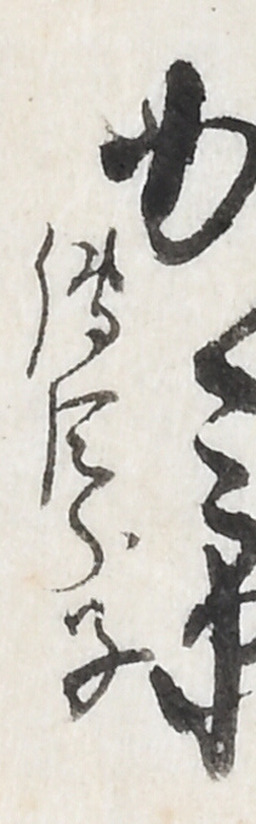伝四郎子
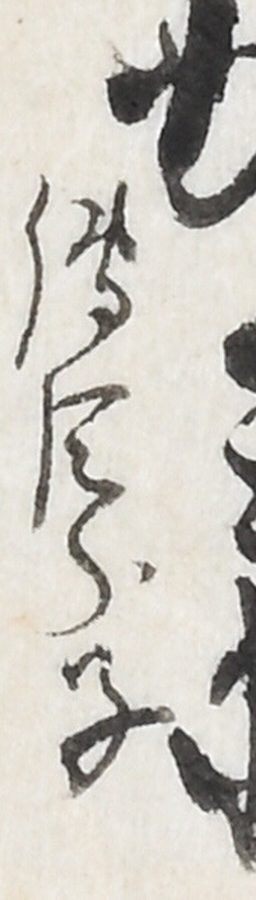伝四郎子
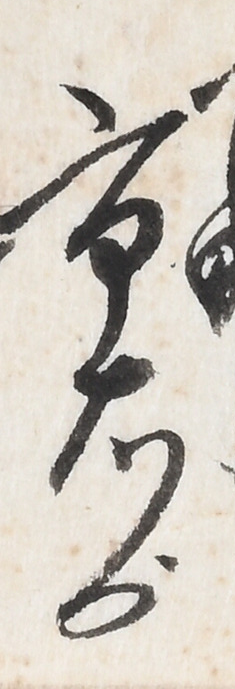市右衛門
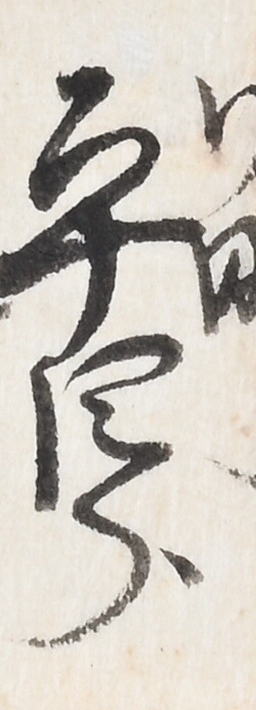平四郎
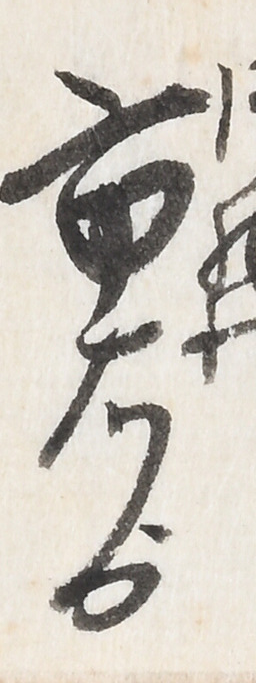市右衛門
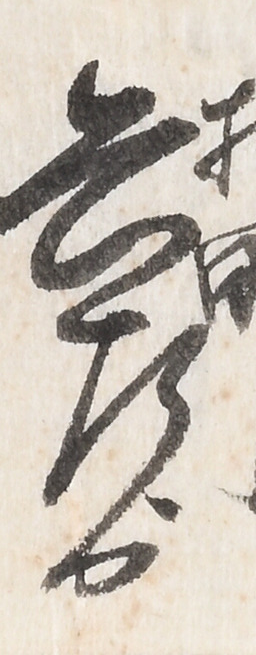甚左衛門
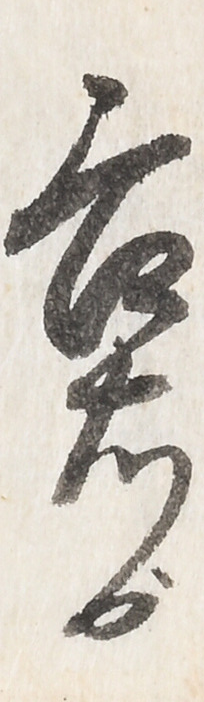市右衛門
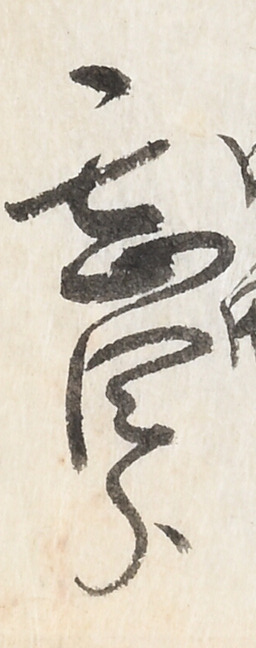平四郎
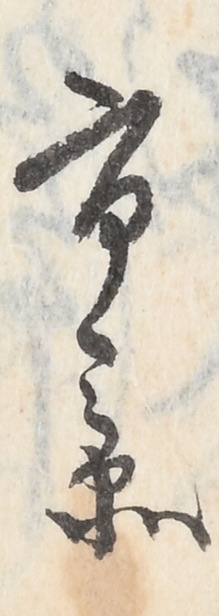加兵衛

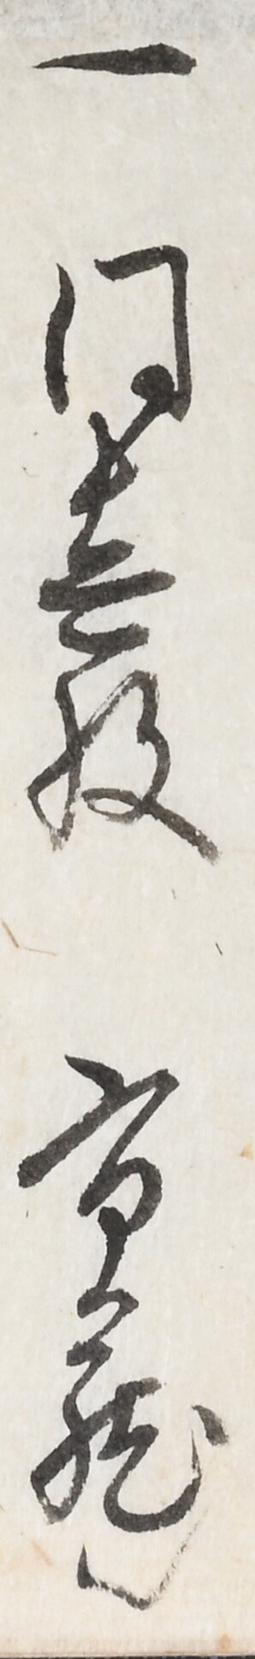一同壱枚市蔵
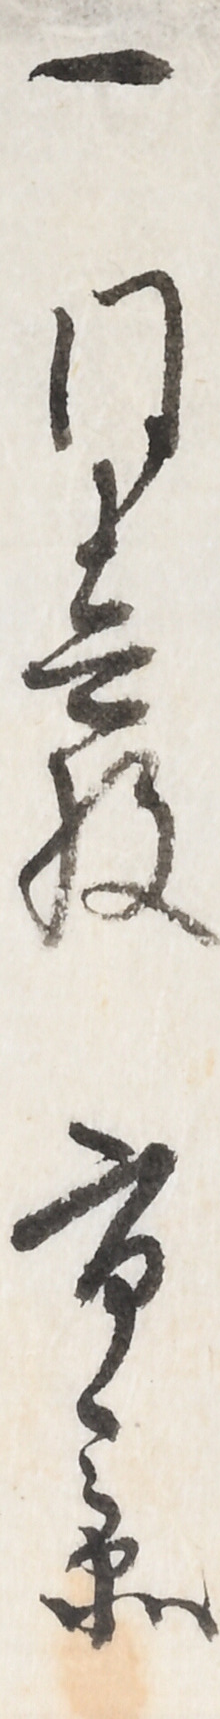一同壱枚市兵衛
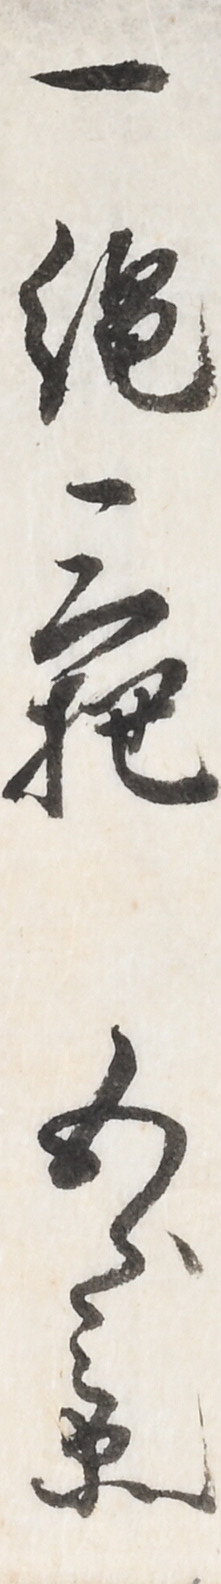一縄三把五郎兵衛
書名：合力覚帳
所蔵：伊那市立高遠町図書館・合同会社AMANE
